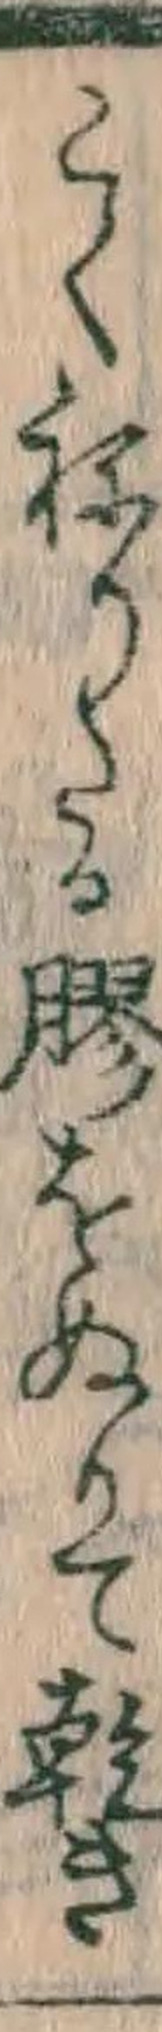こくねりたる膠をぬりて乾き
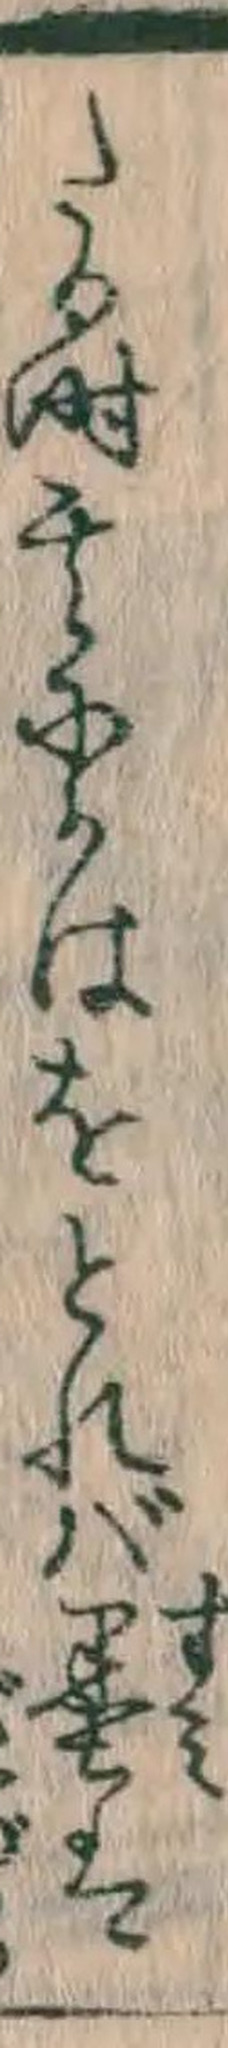たる時其にかはをとれば墨は
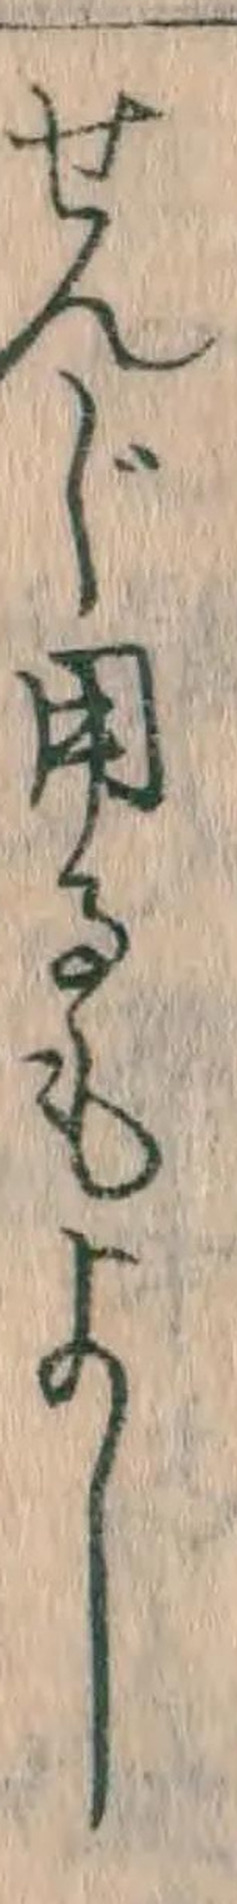せんじ用るもよし
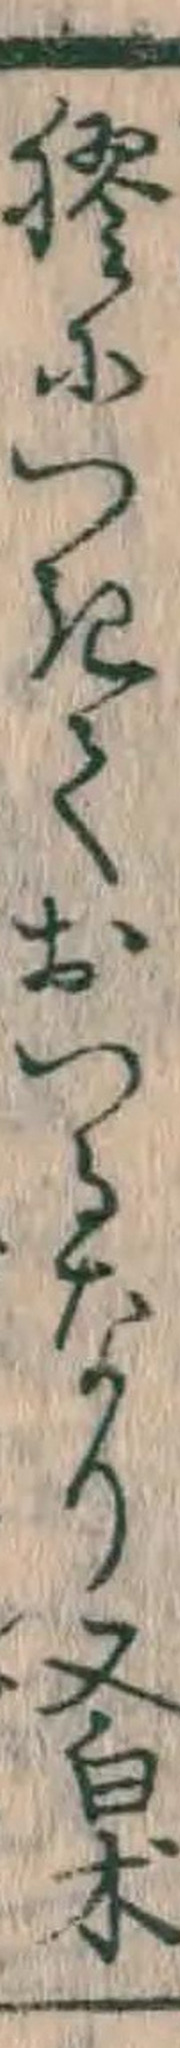膠につきておつるなり又白朮
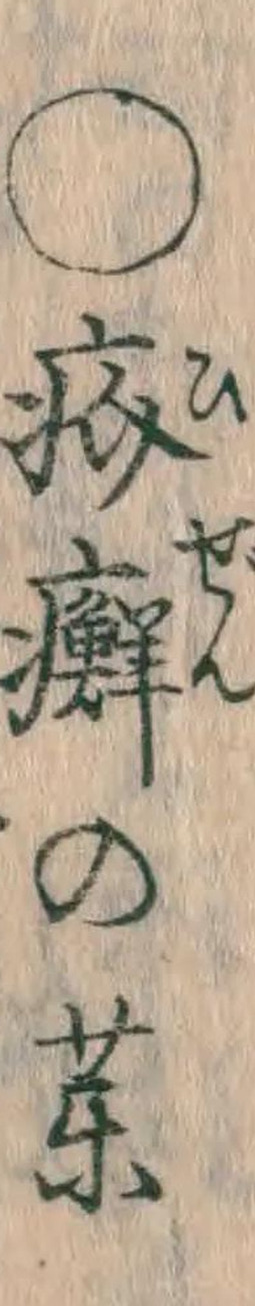○疥癬の薬
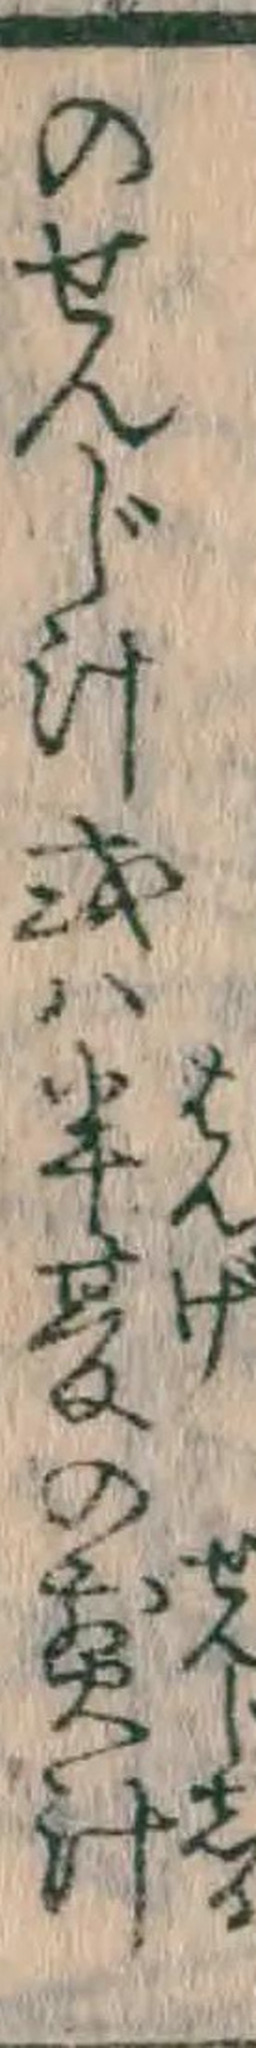のせんじ汁或は半夏の煎汁
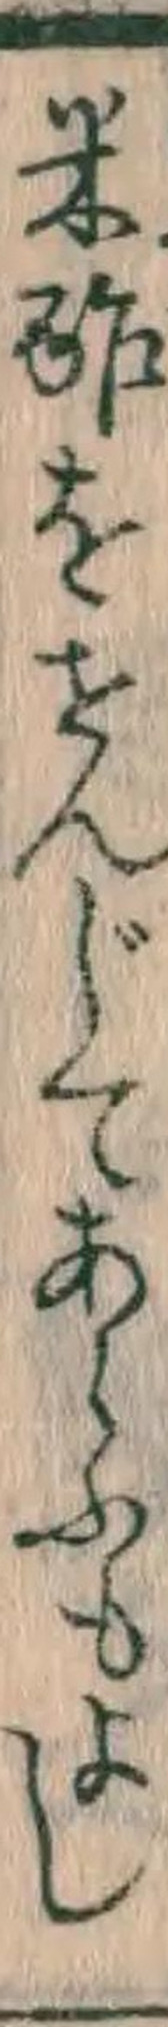米酢をせんじてあらふもよし
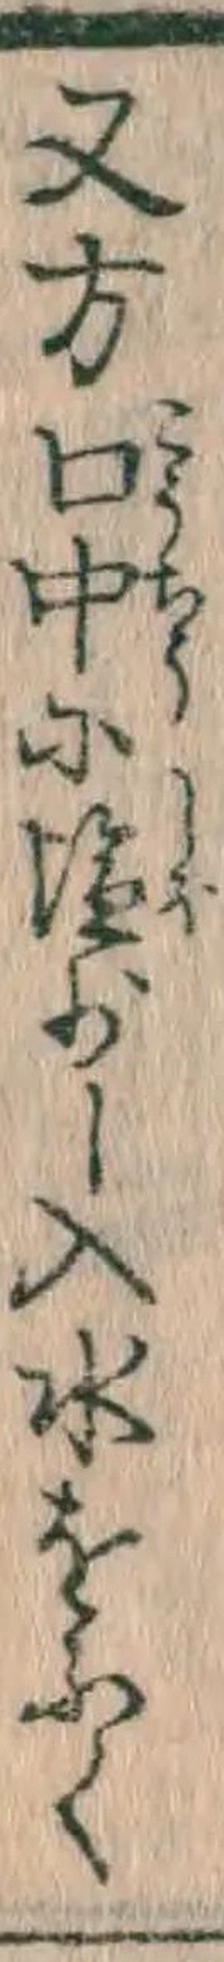又方口中に塩少し入水をふく
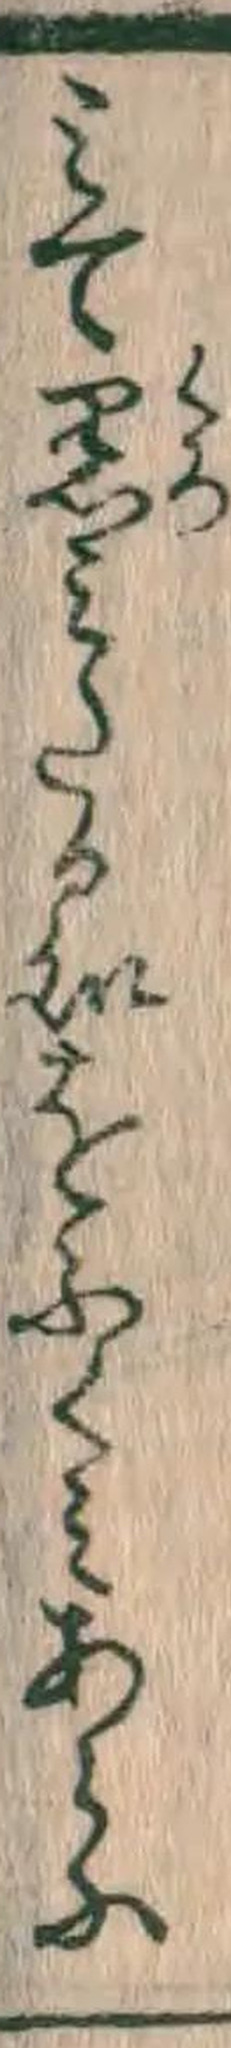みて黒みたる処をふくみあらふ
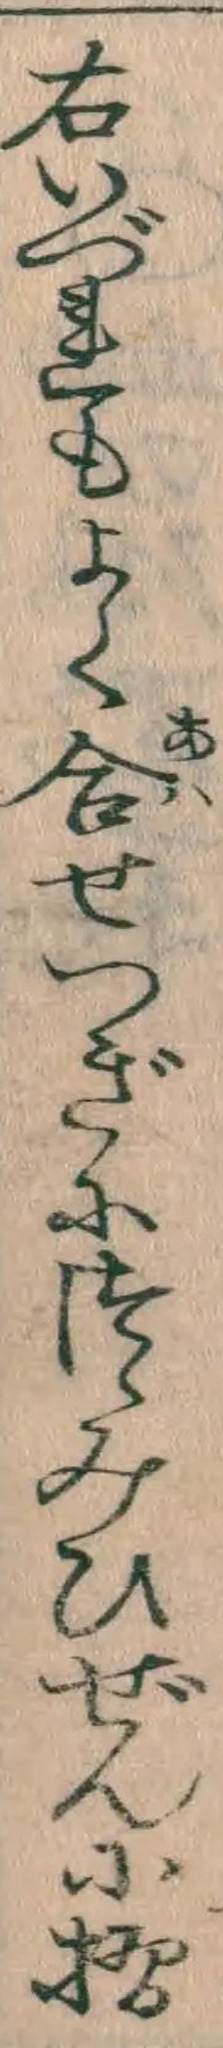右いづれもよく合せつぎにつゝみひぜんに摺
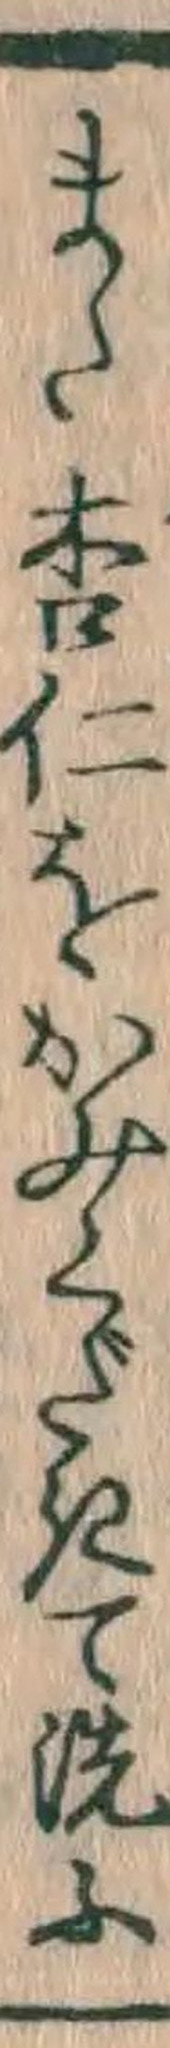また杏仁をかみくだきて洗ふ
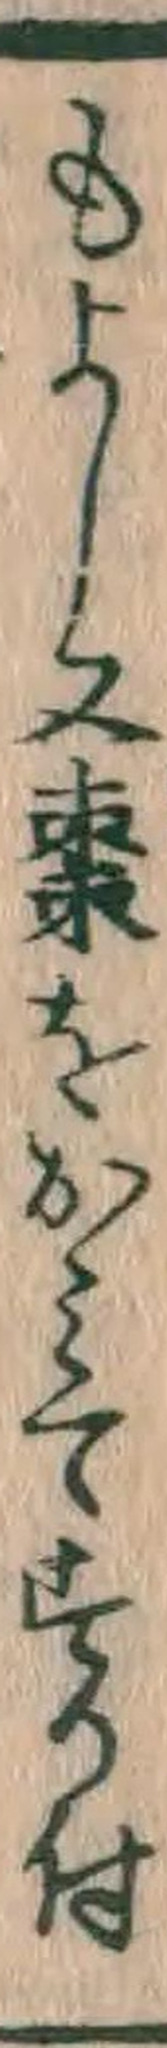もよし又棗をかみてすり付
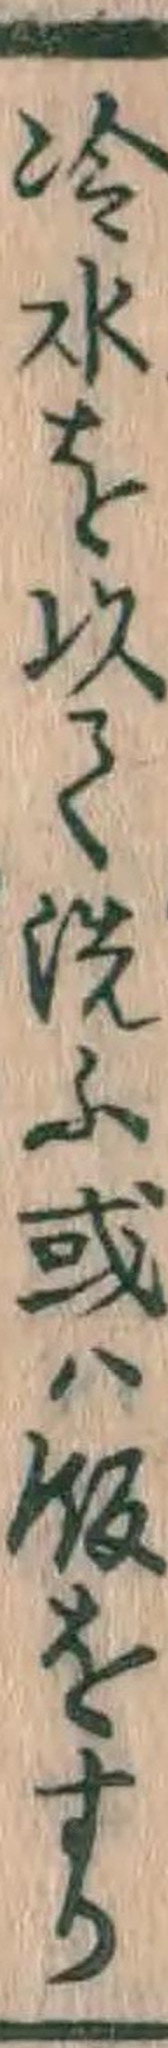冷水を以て洗ふ或は飯をすり
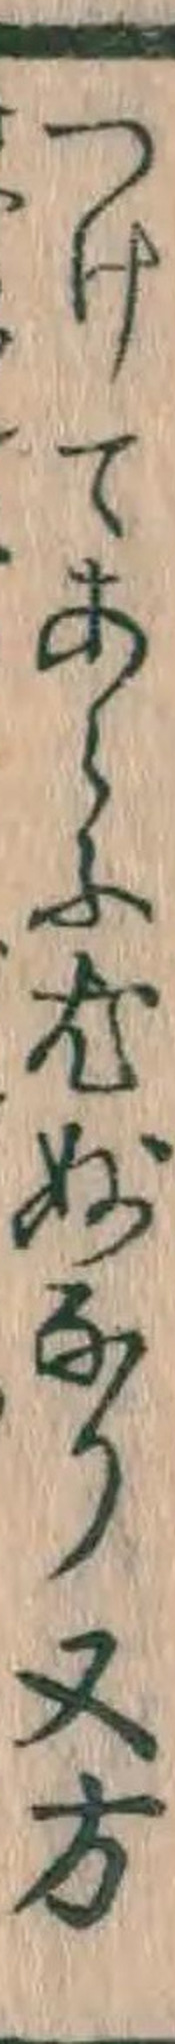つけてあらふ尤妙なり又方
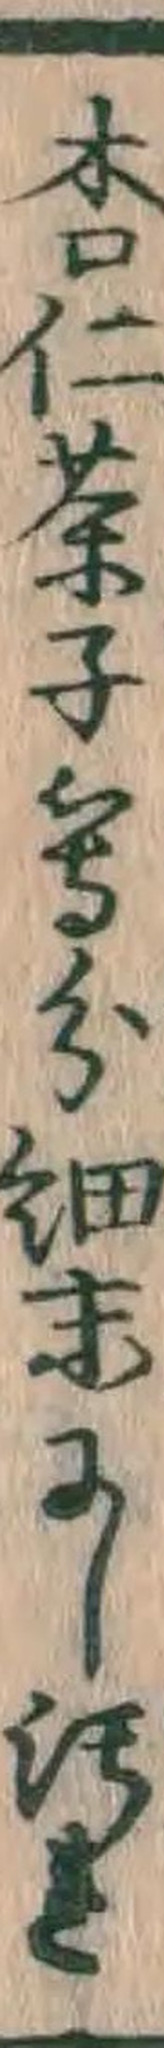杏仁茶子等分細末にし汚れ
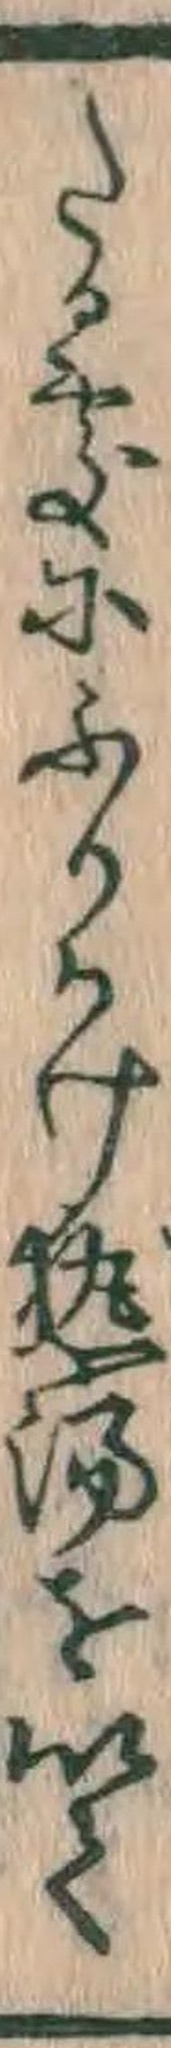たる處にふりかけ熱湯を以て
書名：広益秘事大全 3巻. [3]
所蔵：国立国会図書館 National Diet Library, JAPAN
